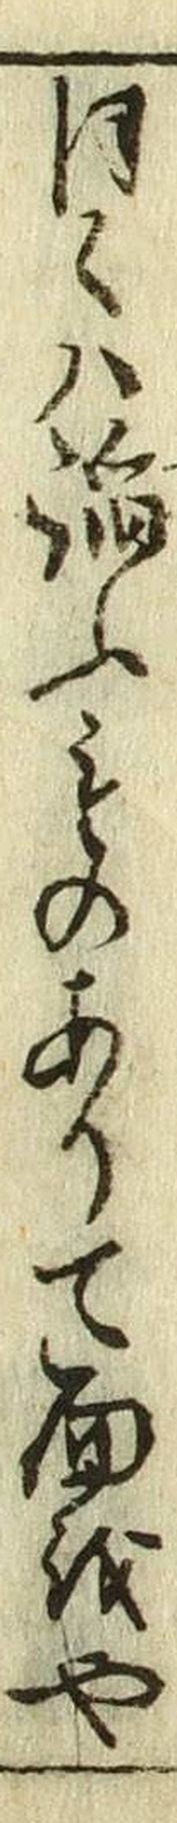ほくは諂ふものありて面をや
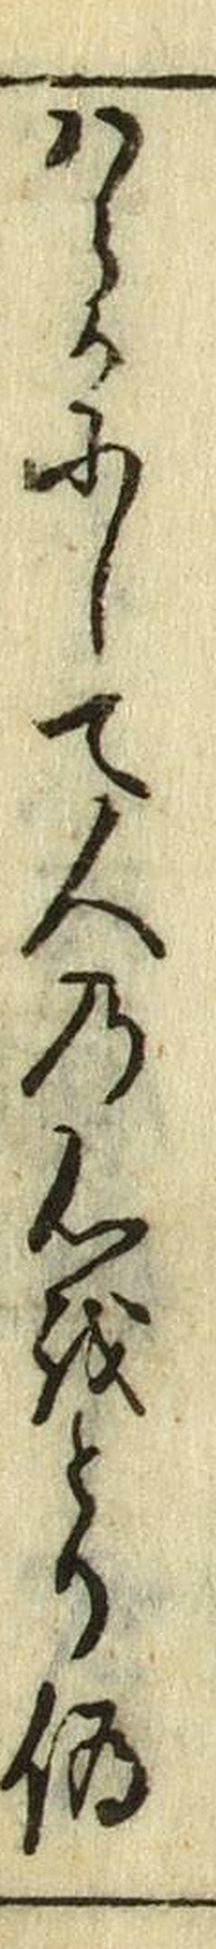はらかにして人の心をとり偽

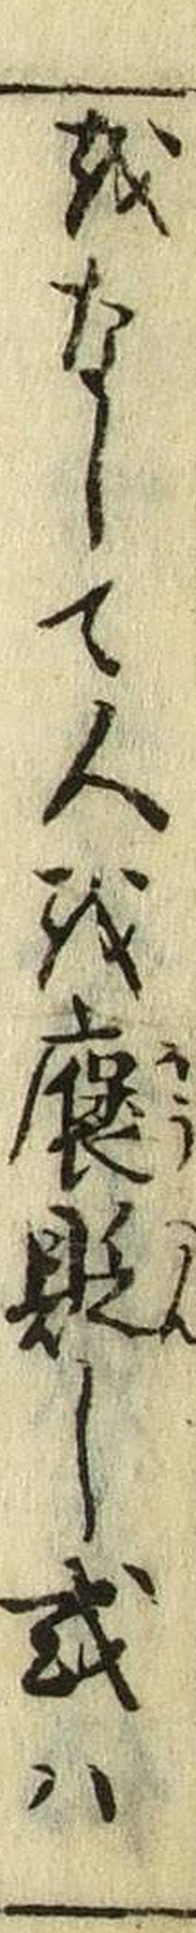をなして人を褒貶し或は
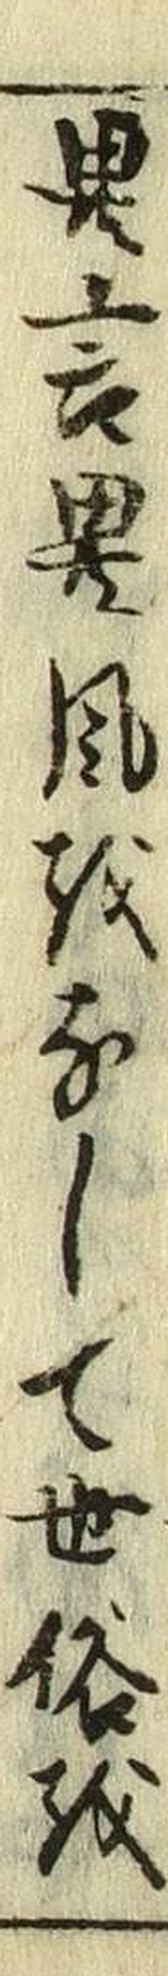異言異風をなして世俗を
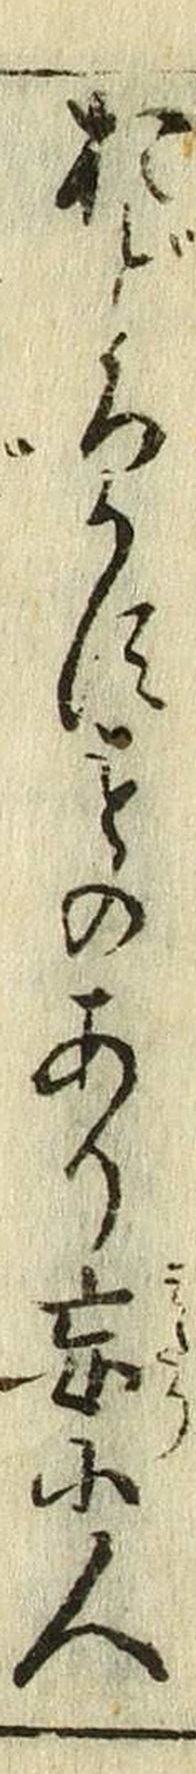おどろかすものあり妄に人
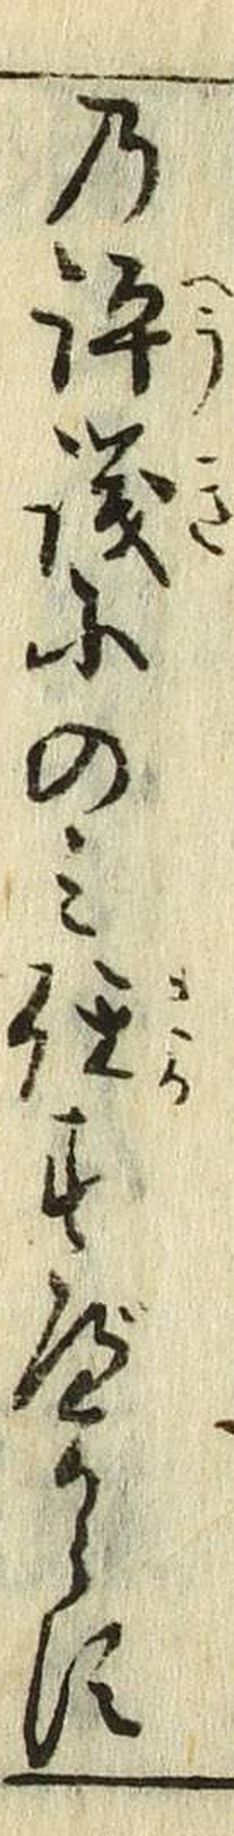の評議にのみ任すべからす
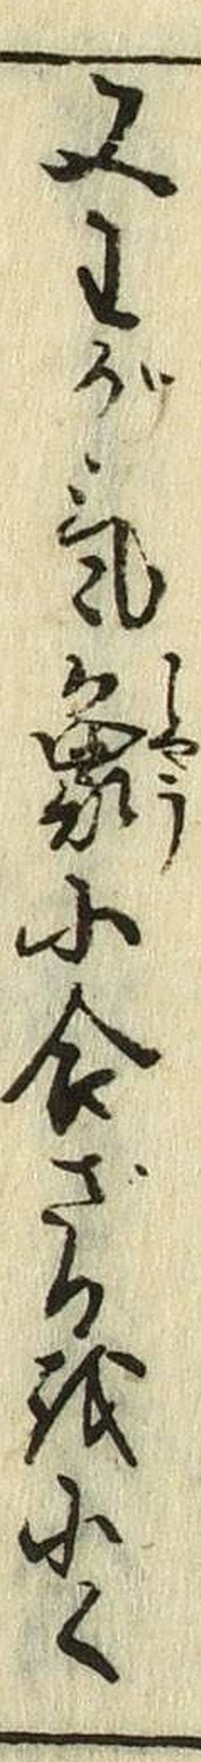又わが気象に合ざるをにく
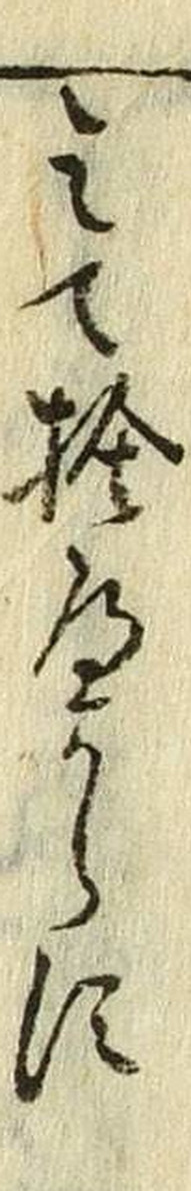みて捨へからす
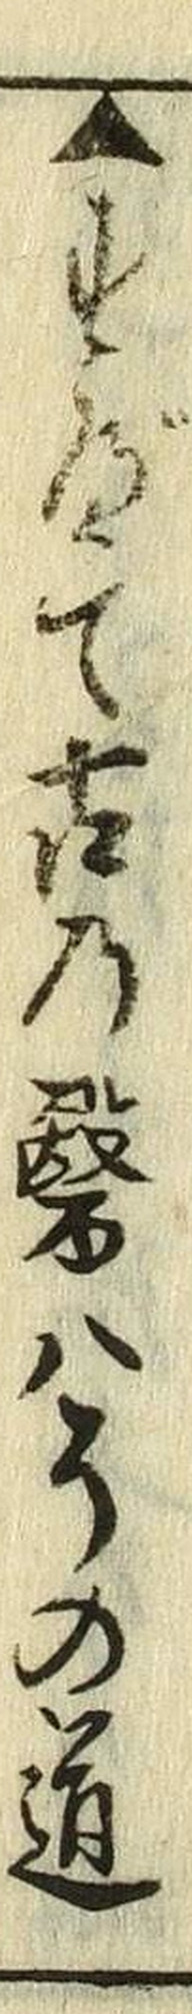▲すべて古の医はその道
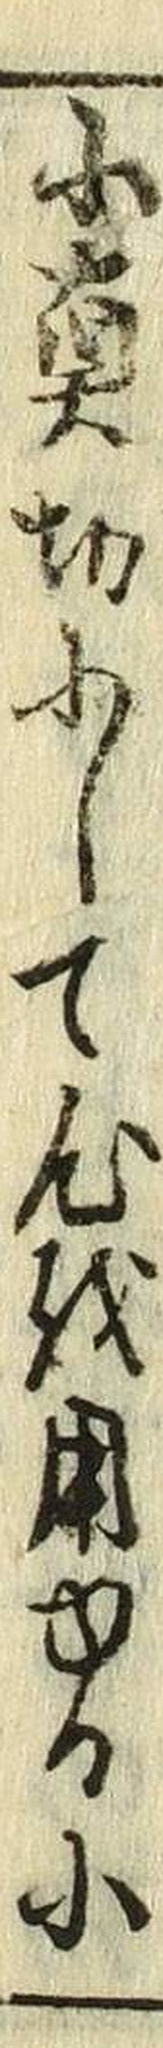に真切にして心を用ゆるに
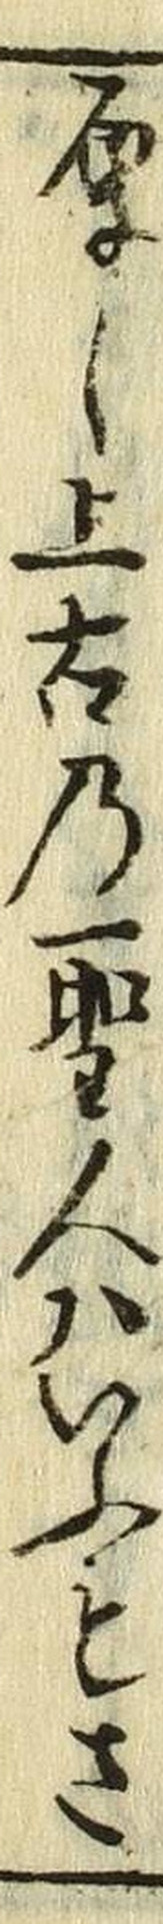厚し上古の聖人はいふもさ
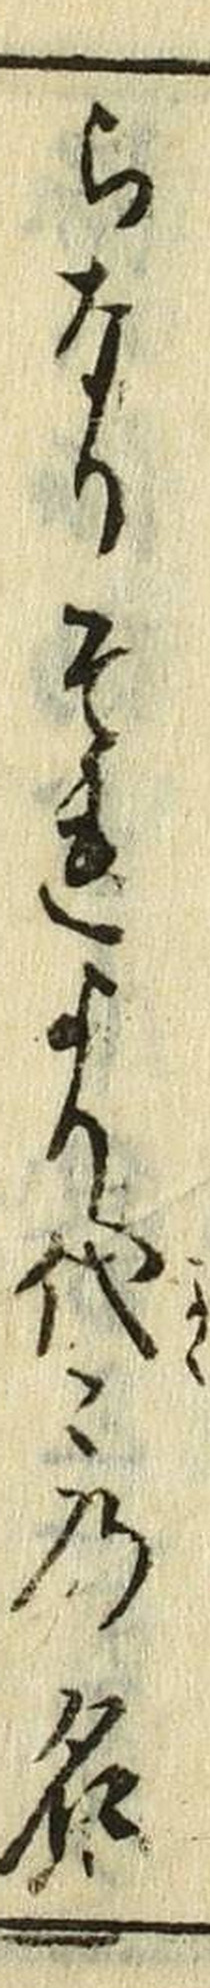らなりそれより代々の名
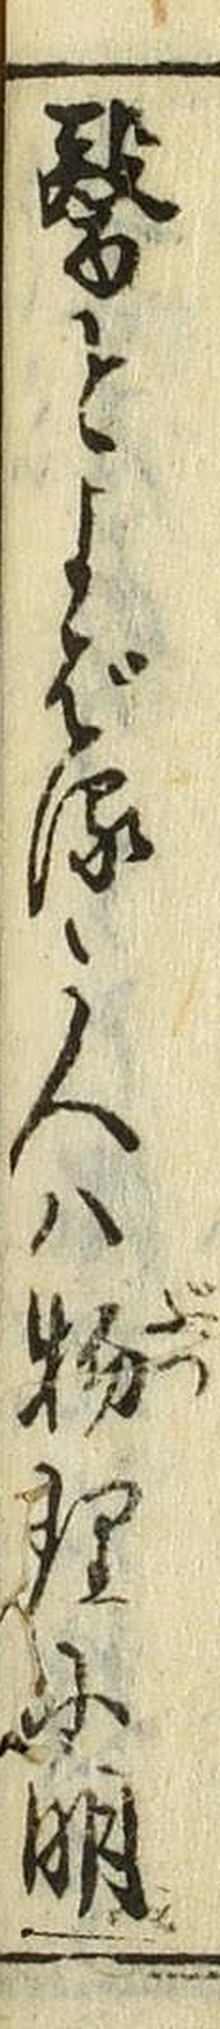医とよばるゝ人は物理に明
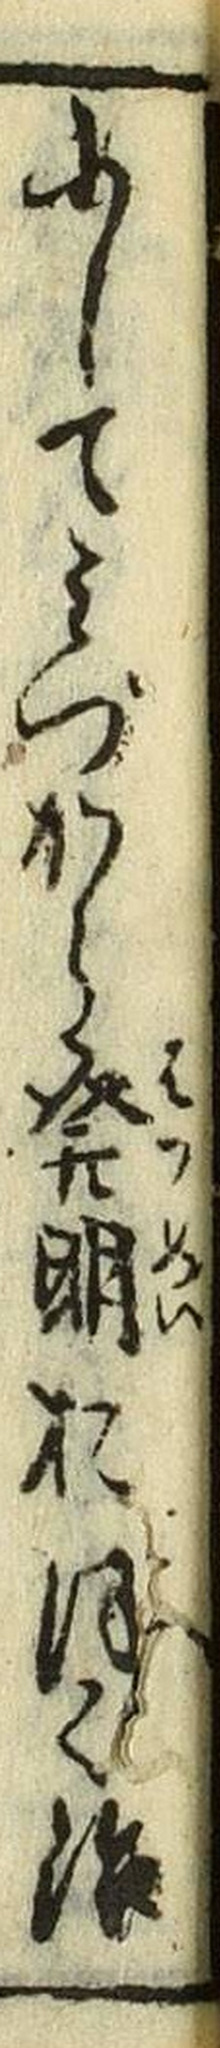にしてみづから発明おほく治
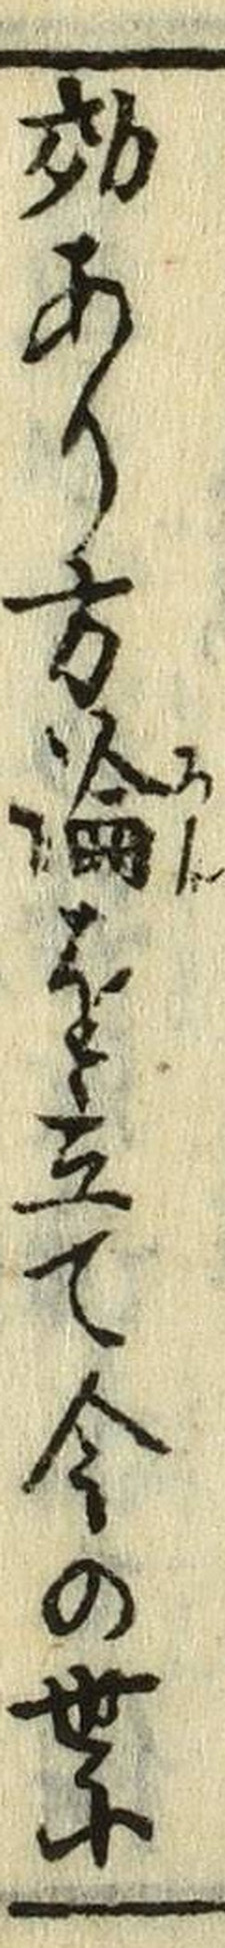効あり方論を立て今の世に
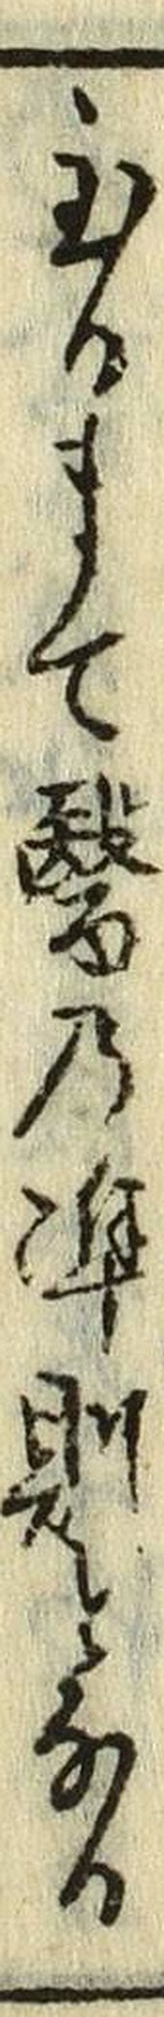至るまて医の準則となる
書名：居家養生記
